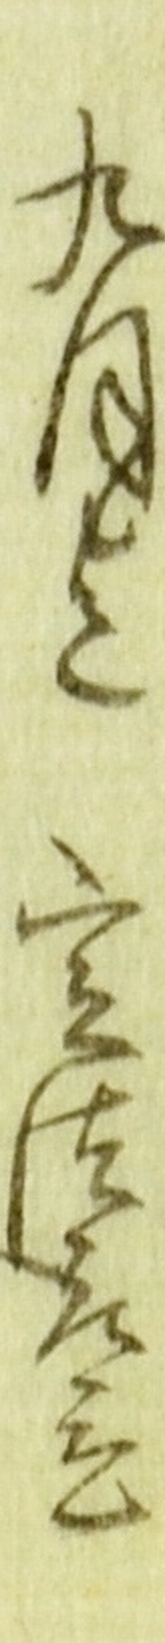九月迄定法取立
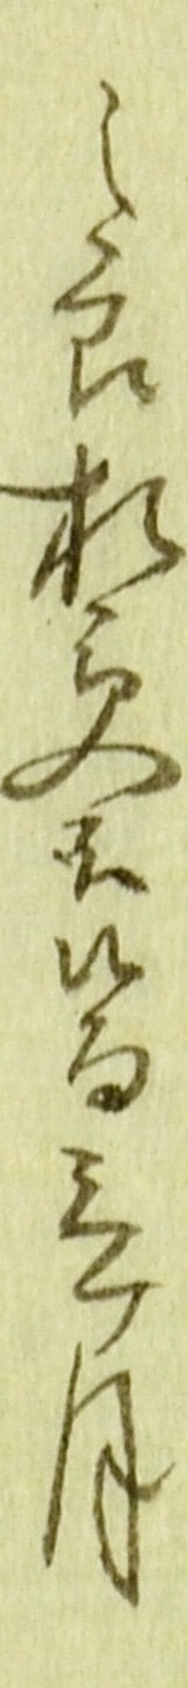之節相受取候而三ヶ月
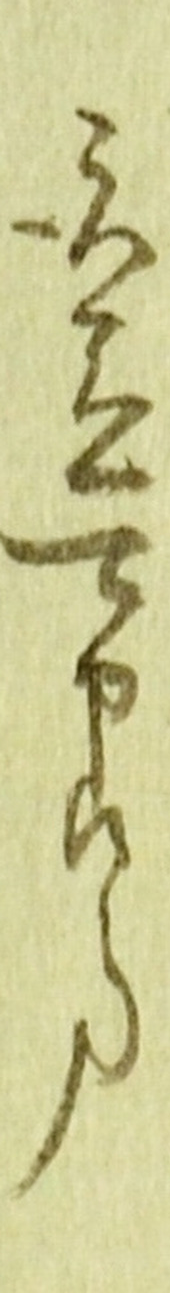取立可申候事
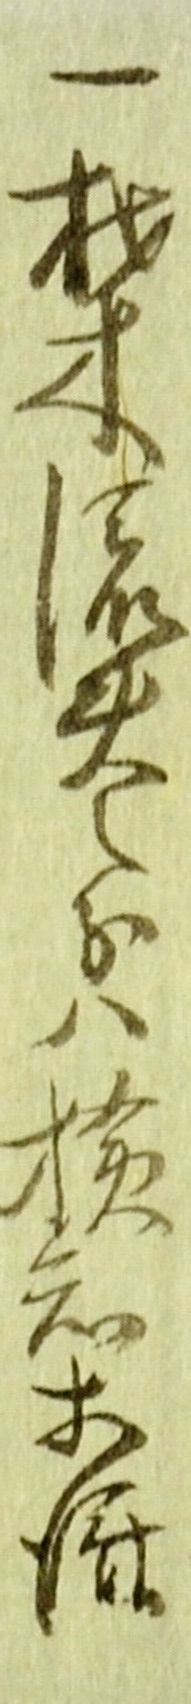一材木流失之分ハ検知相済
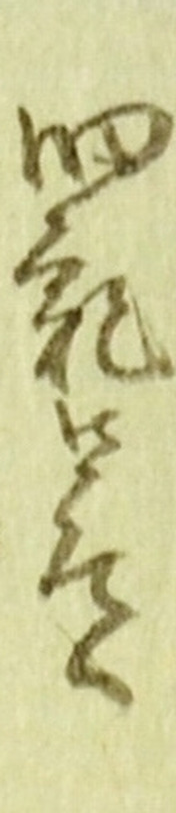旧記御座候
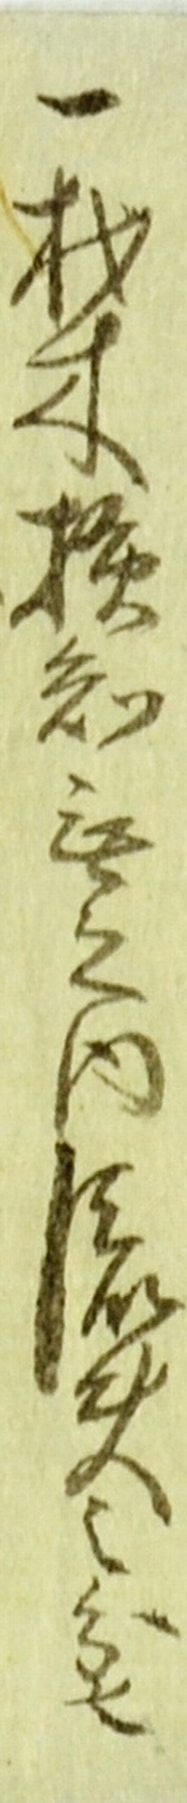一材木検知無之内流失之分七
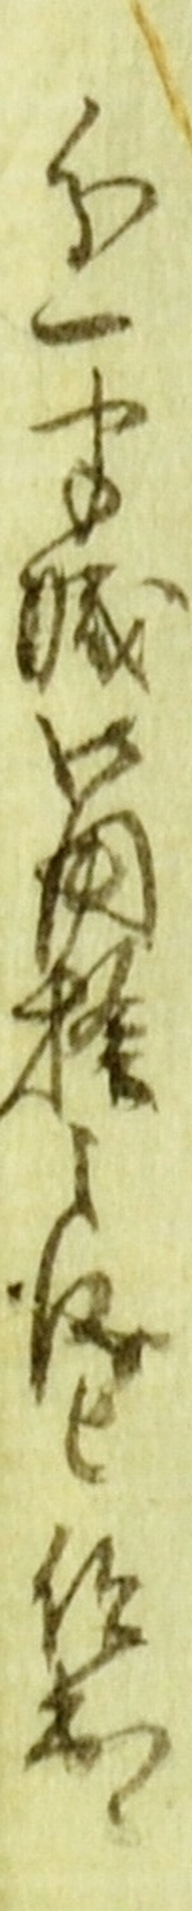分一半臓御用捨之儀被仰出候

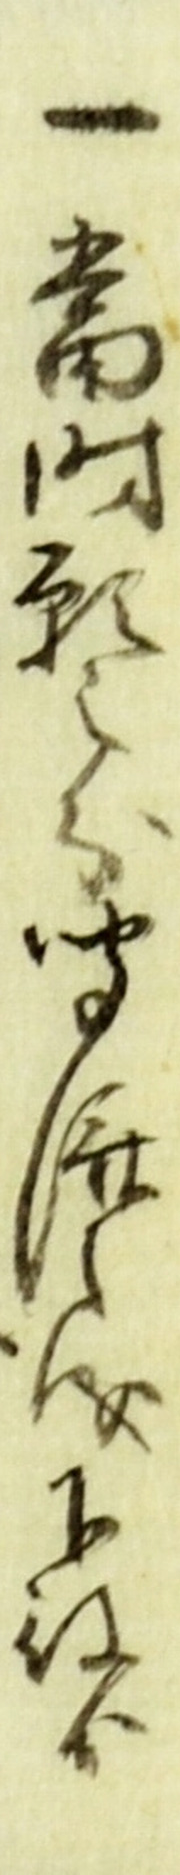一当時願之分聞済之儀下役ゟ
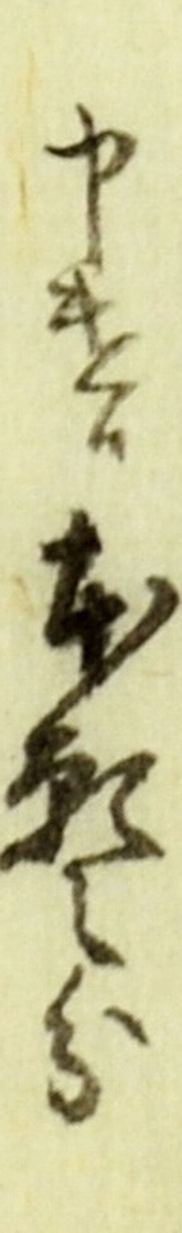申遣候本願之分
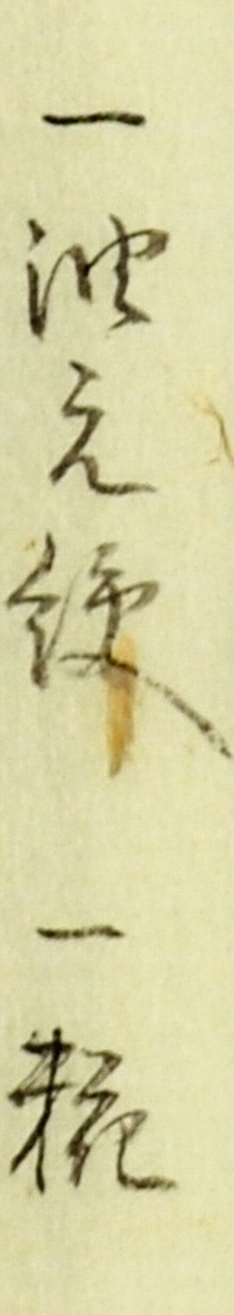一油元紋一糀
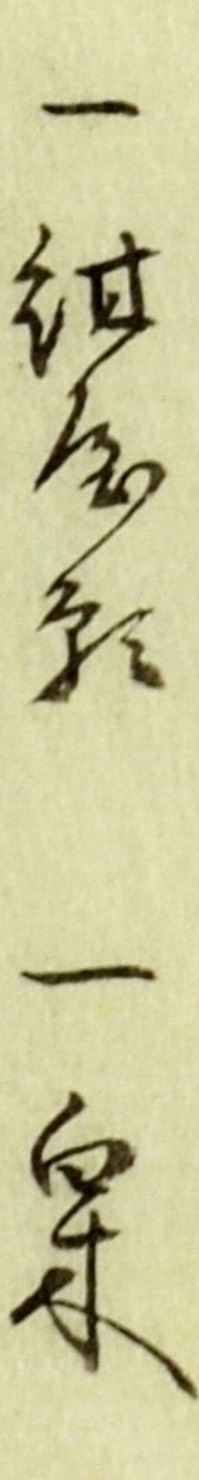一紺屋願一白木
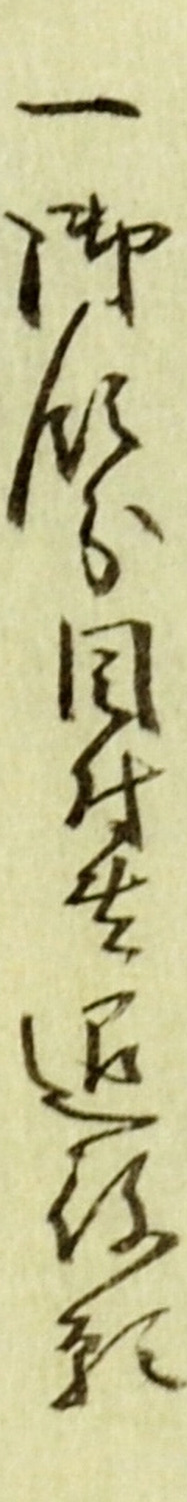一御領分目付共退役願
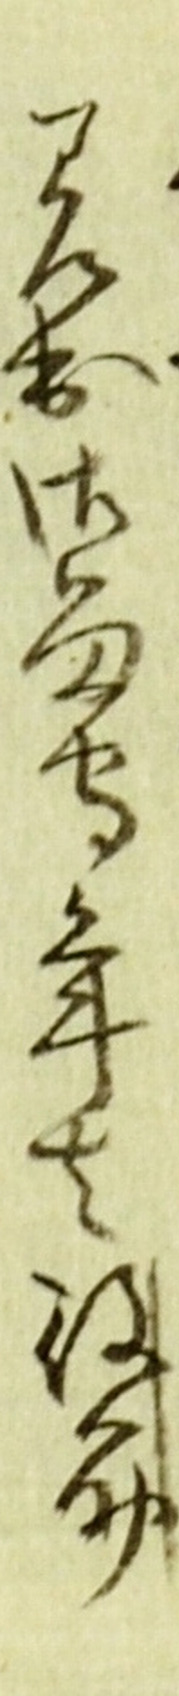差出御留守年者役筋
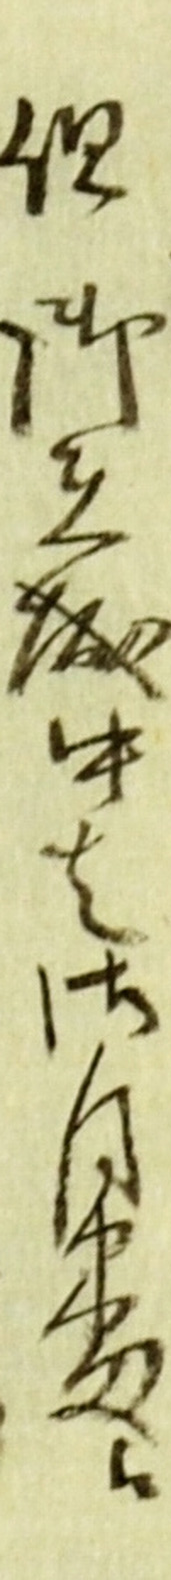但御在城中者御自番候
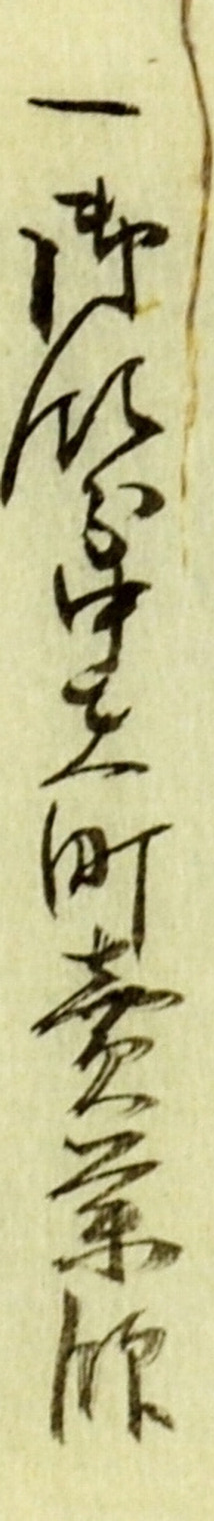一御領分中在町売茶師
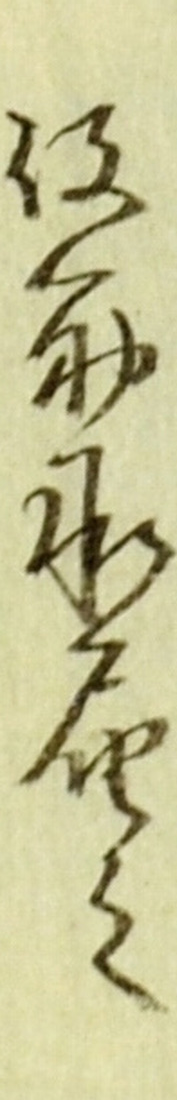役筋承届之
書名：分一御定法
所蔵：伊那市立高遠町図書館・合同会社AMANE
